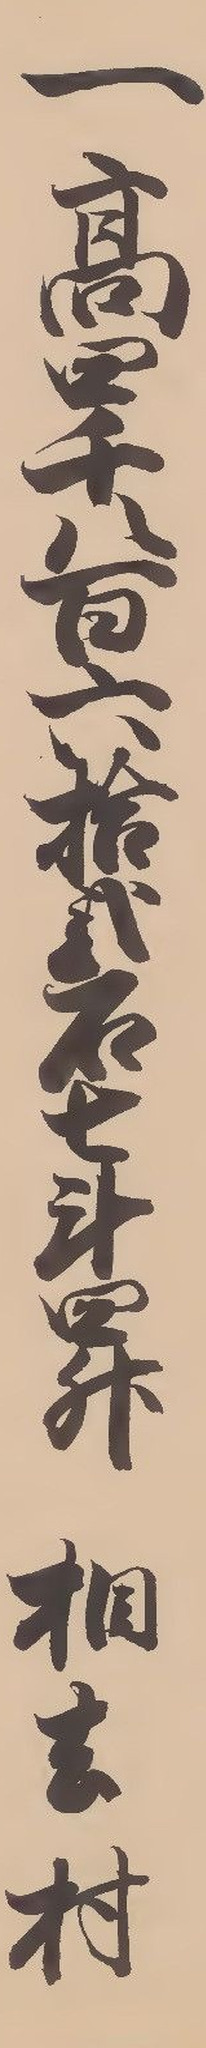一高四千八百六拾弐石七斗四升相去村
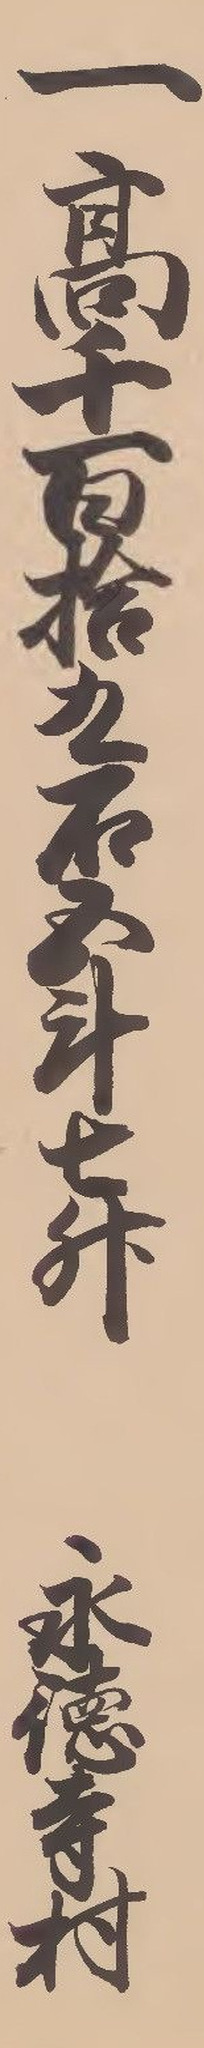一高千百拾九石五斗七升永徳寺村
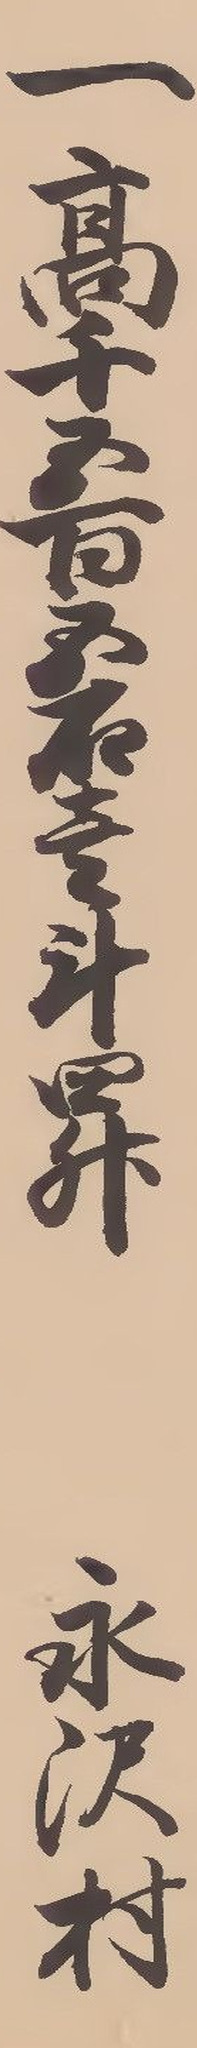一高千五百五石壱斗四升永沢村
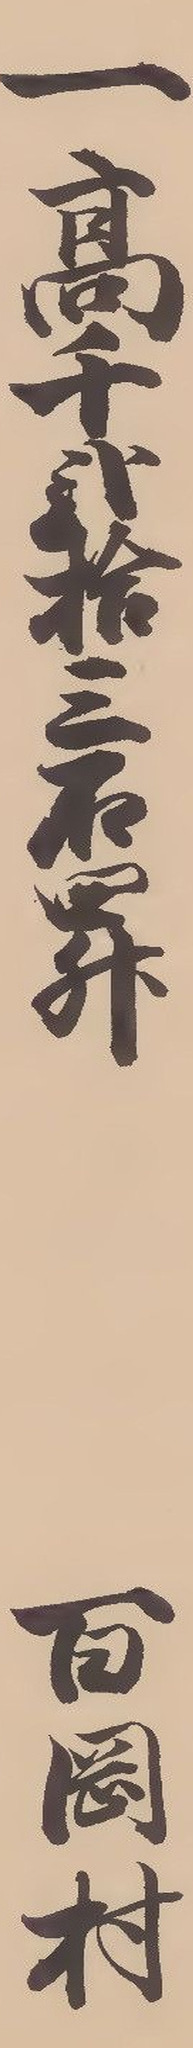一高千弐拾三石四升百岡村
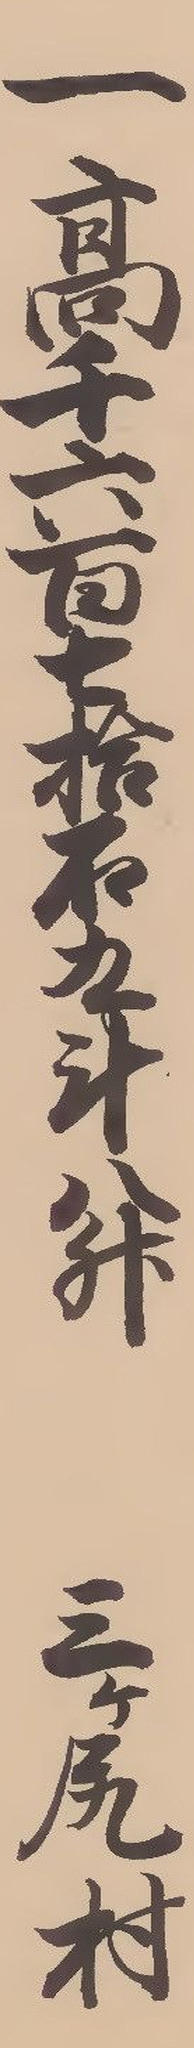一高千六百七拾石九斗八升三ヶ尻村
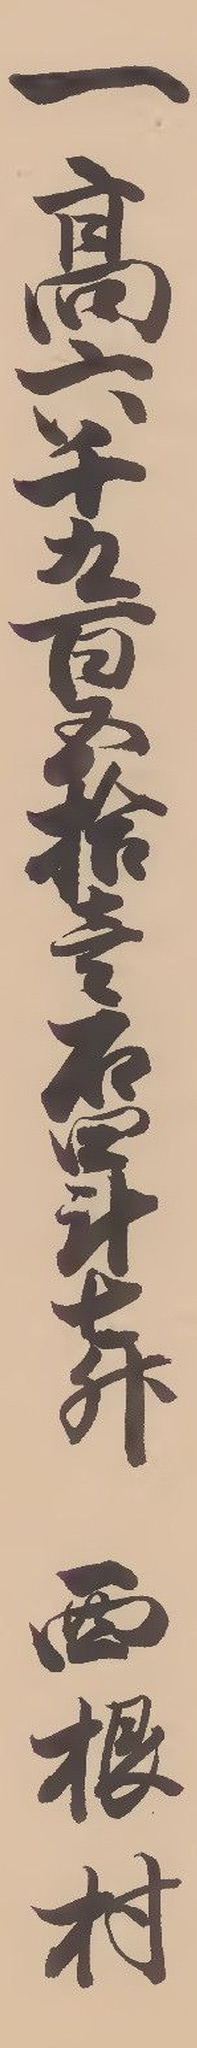一高六千九百五拾壱石四斗七升西根村

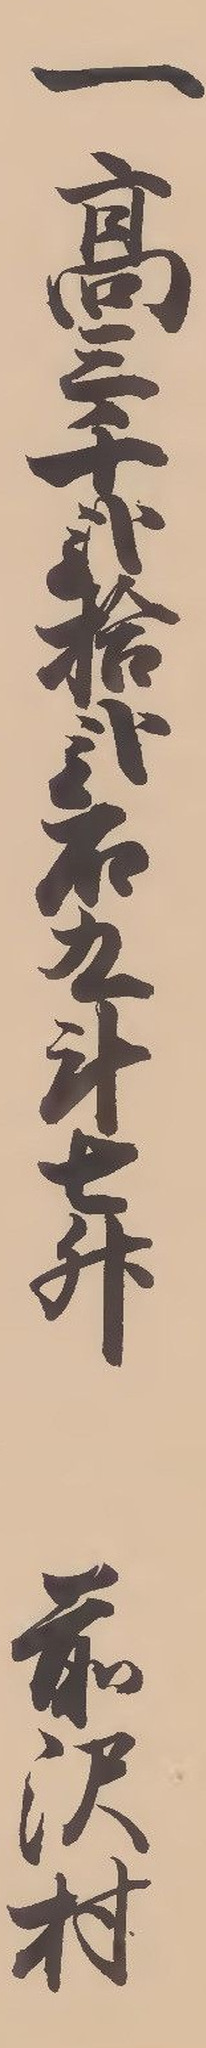一高三千弐拾弐石九斗七升前沢村
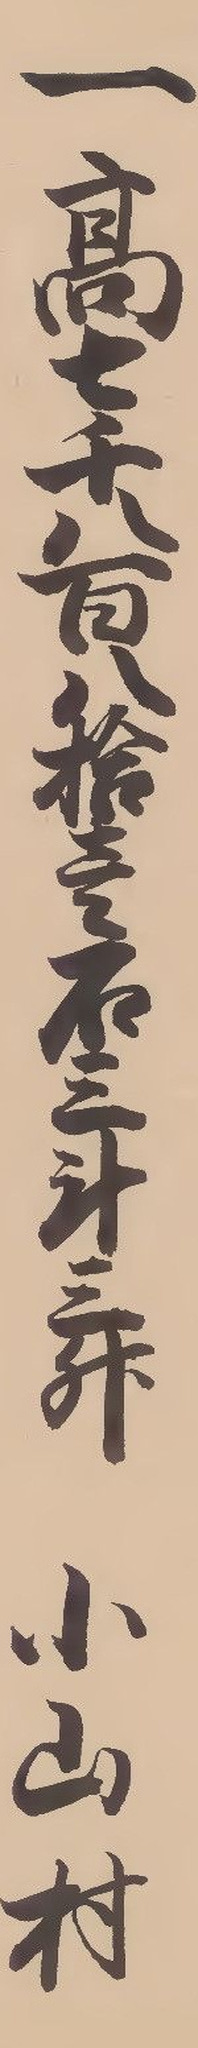一高七千八百八拾壱石三斗三升小山村
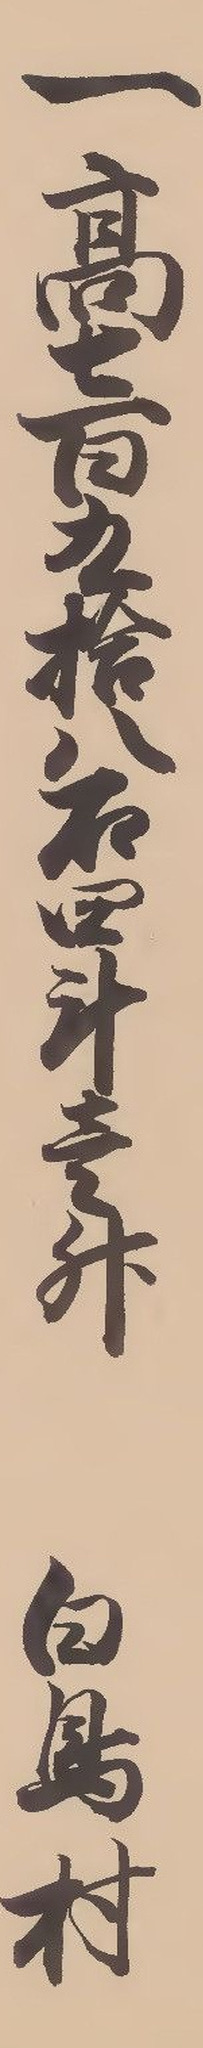一高七百九拾八石四斗壱升白鳥村
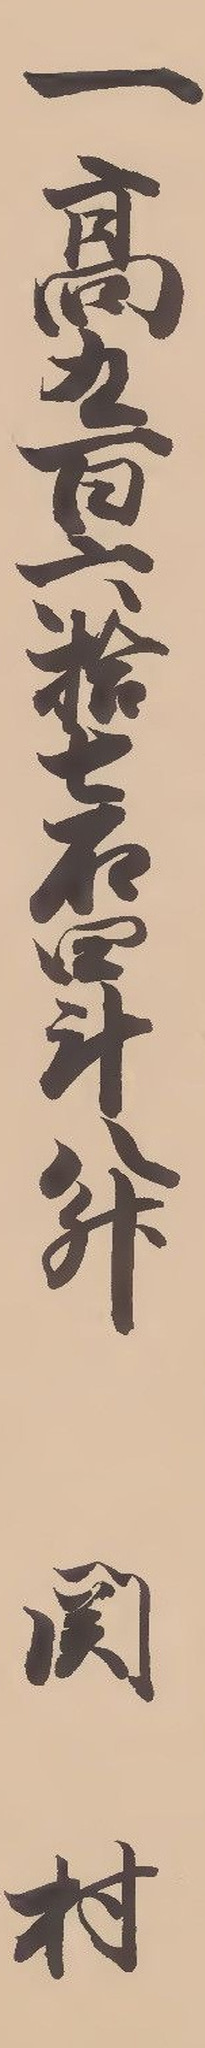一高九百六拾七石四斗八升関村
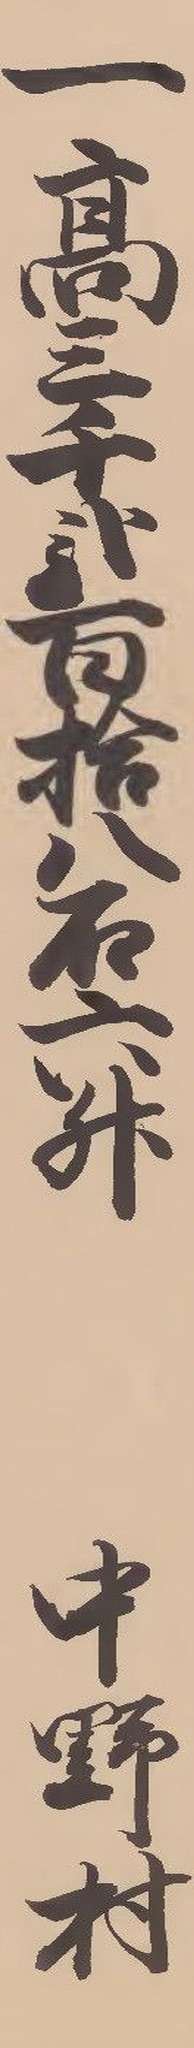一高三千弐百拾八石六升中野村
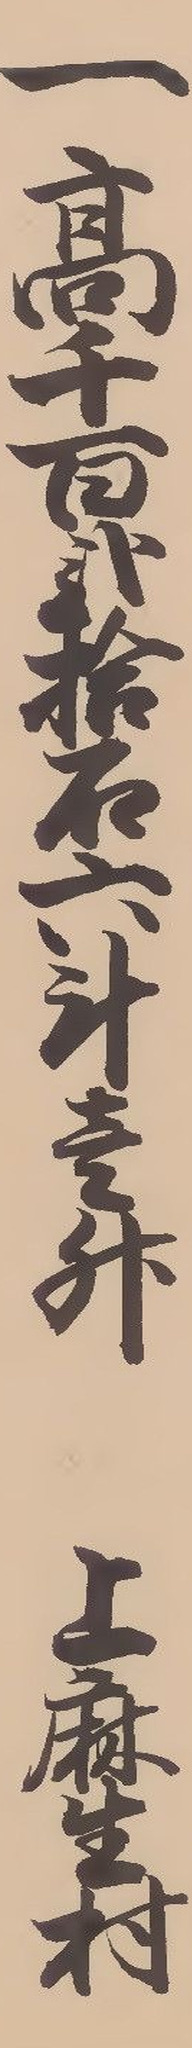一高千百弐拾石六斗壱升上麻生村
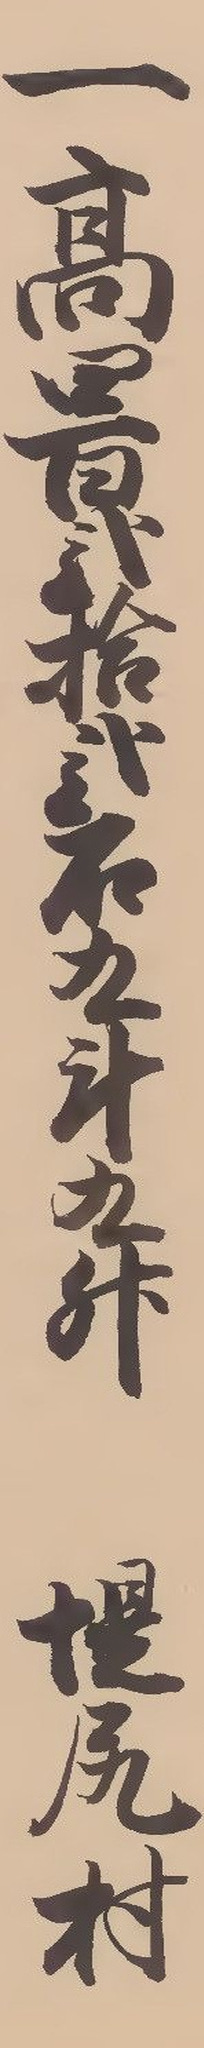一高四百弐拾弐石九斗九升堤尻村
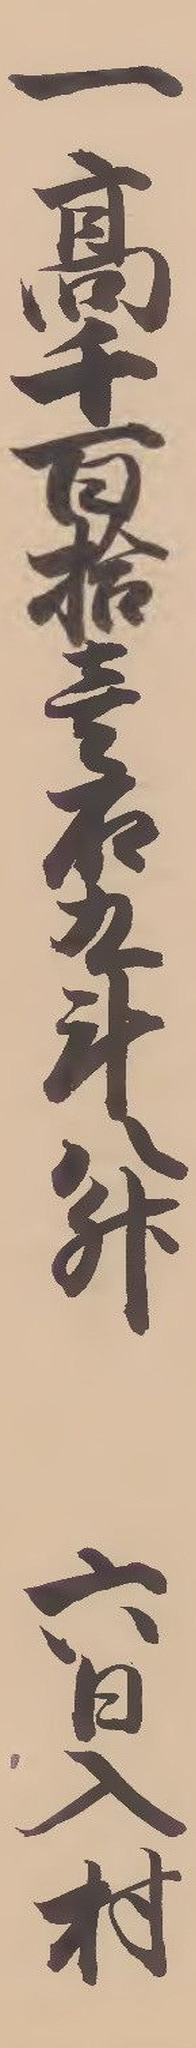一高千百拾壱石九斗八升六日入村

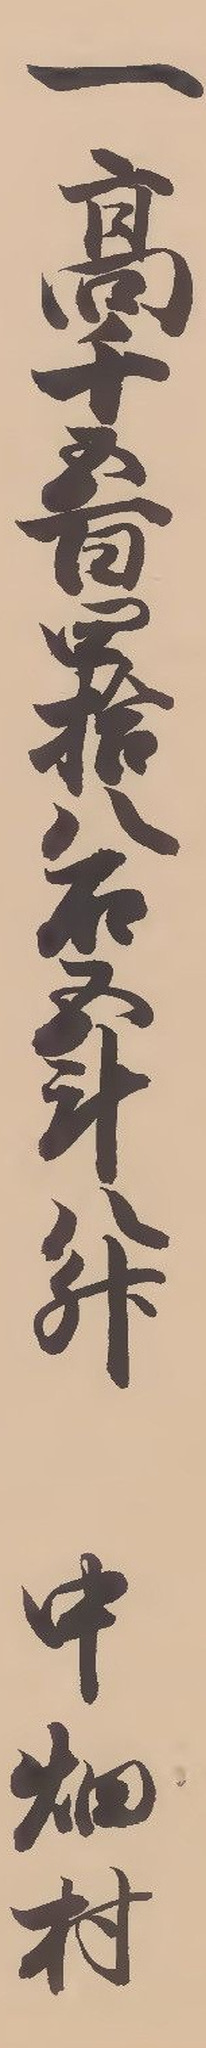一高千五百四拾八石五斗八升中畑村
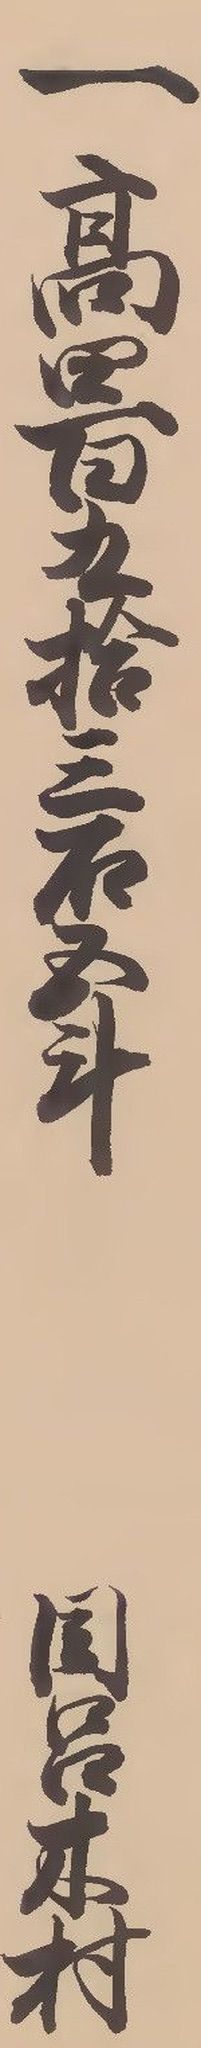一高四百九拾三石五斗目呂木村
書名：陸奥国郷帳　５
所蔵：国立公文書館 National Archives of Japan
